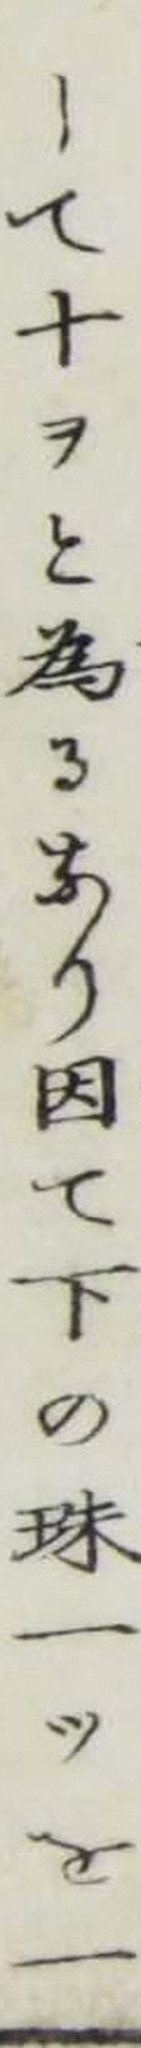して十ヲと為るなり因て下の珠一ッを一

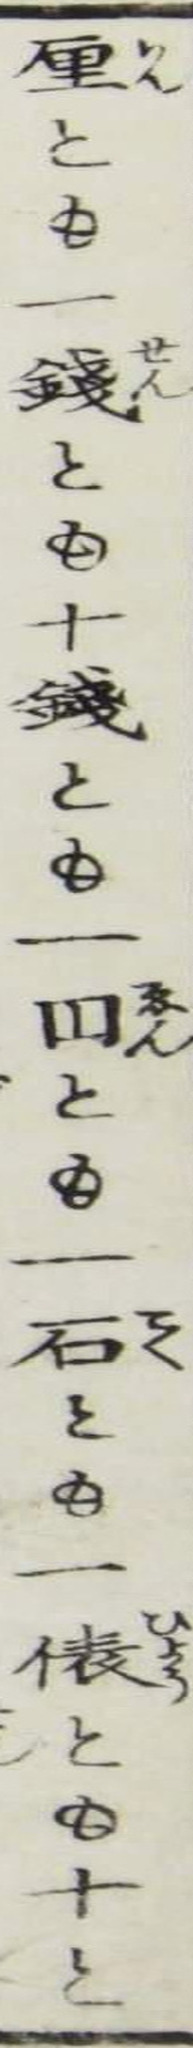厘とも一銭とも十銭とも一円とも一石とも一俵とも十と
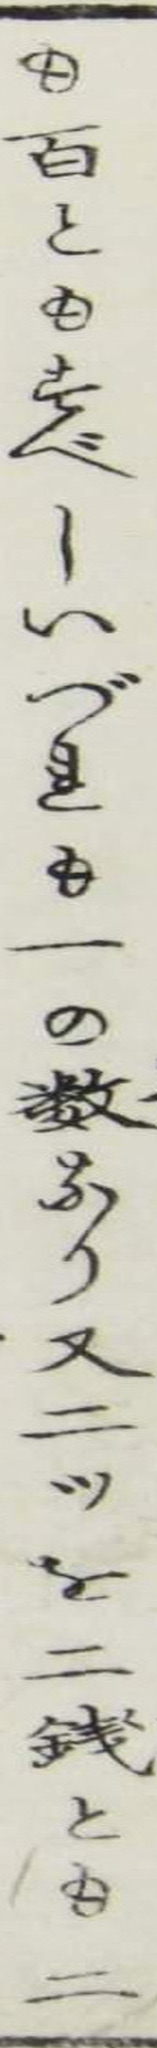も百ともすべしいづれも一の数なり又二ッを二銭とも二
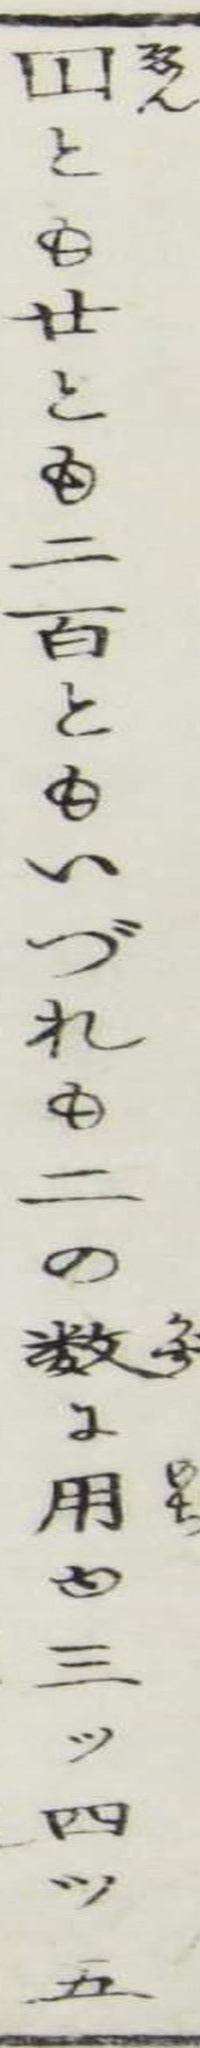円とも廿とも二百ともいづれも二の数に用ゆ三ッ四ッ五
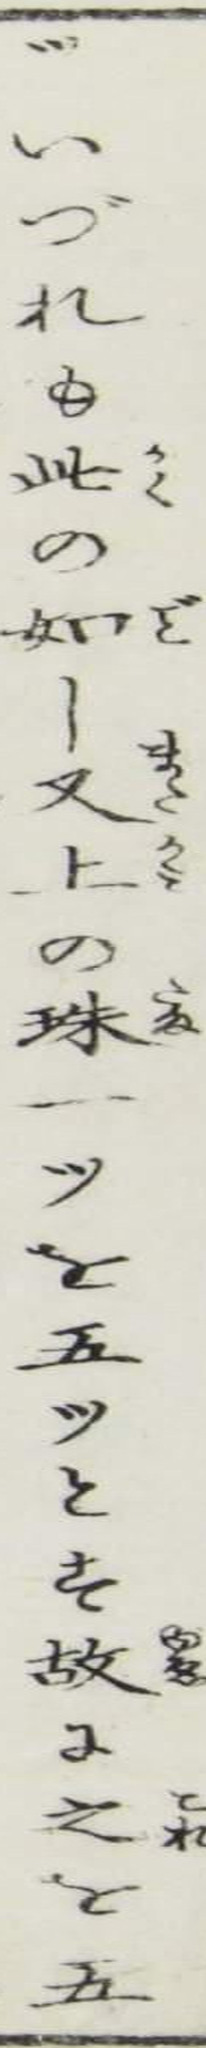ッいづれも此の如し又上の珠一ッを五ッとす故に之を五
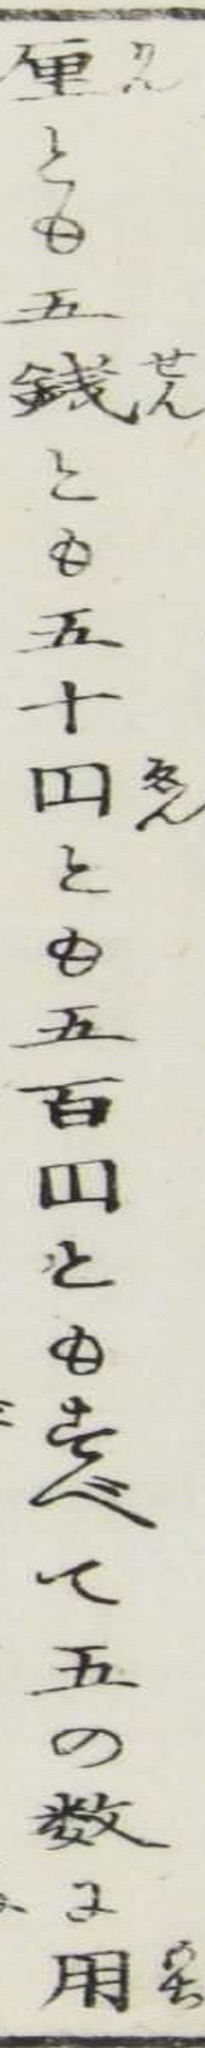厘とも五銭とも五十円とも五百円ともすべて五の数に用
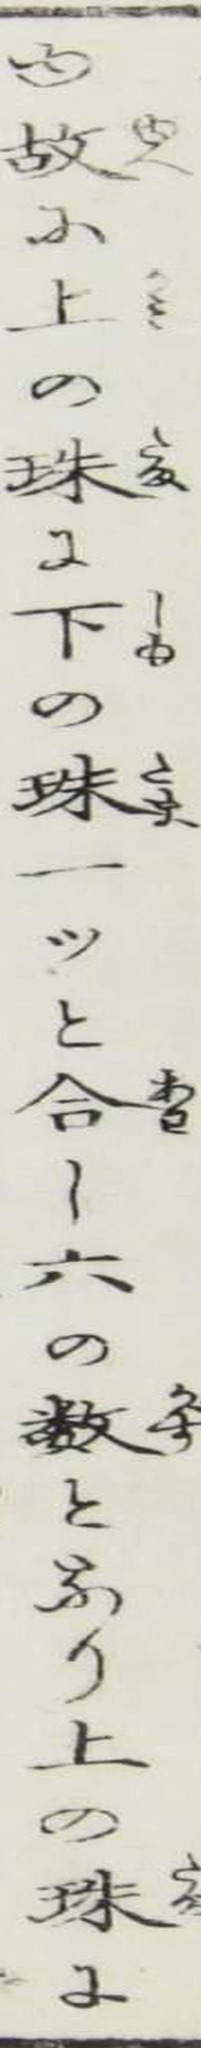ゆ故に上の珠に下の珠一ッと合し六の数となり上の珠に
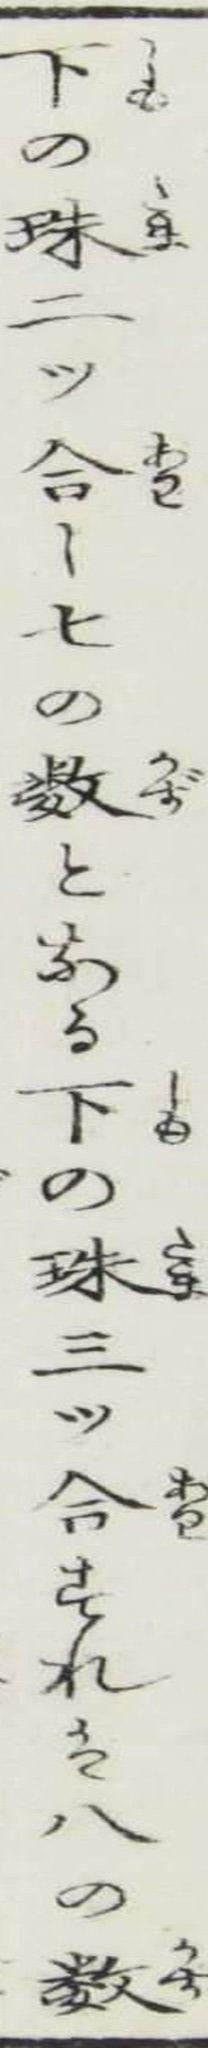下の珠二ッ合し七の数となる下の珠三ッ合すれは八の数
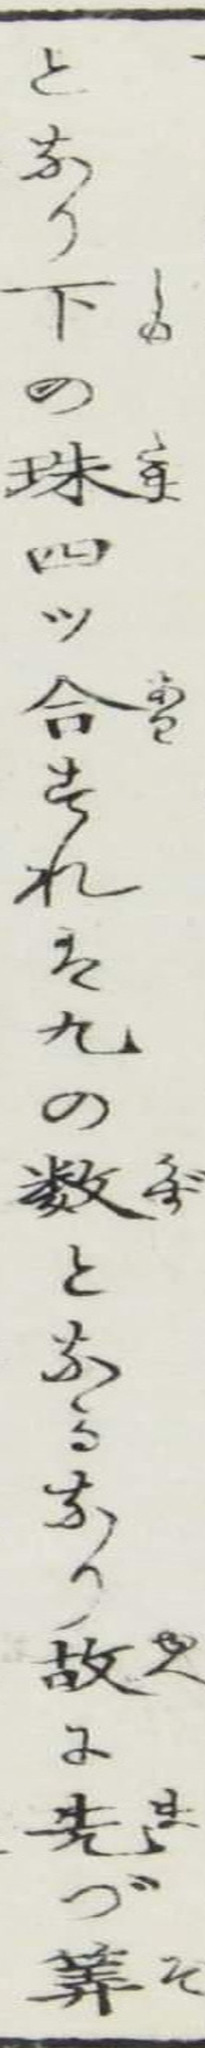となり下の珠四ッ合すれは九の数となるなり故に先づ算
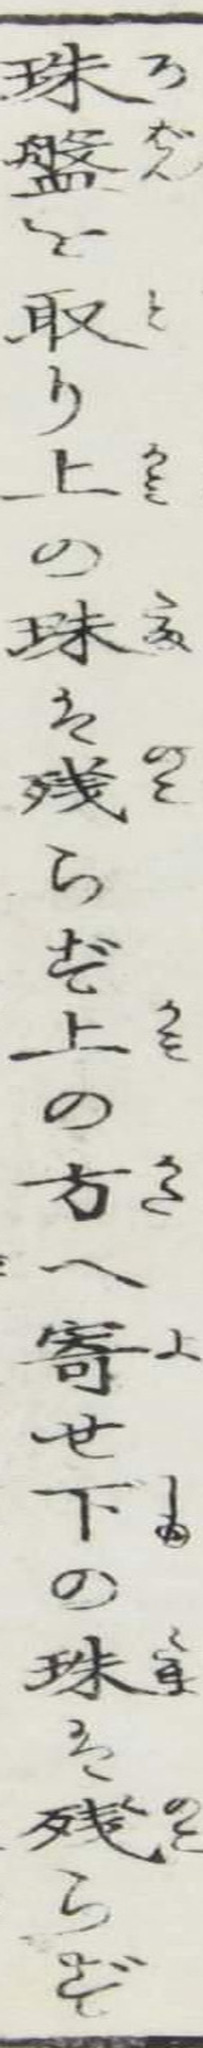珠盤を取り上の珠は残らず上の方へ寄せ下の珠は残らず
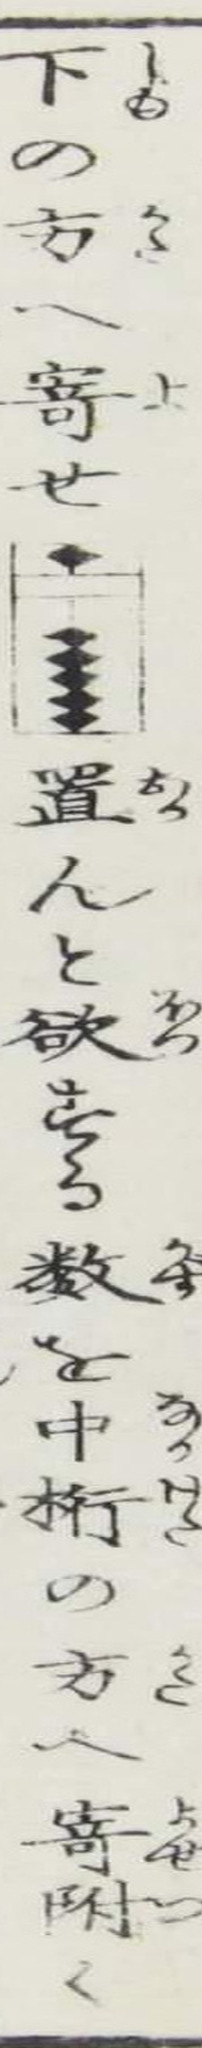下の方へ寄せ置んと欲する数を中桁の方へ寄附く
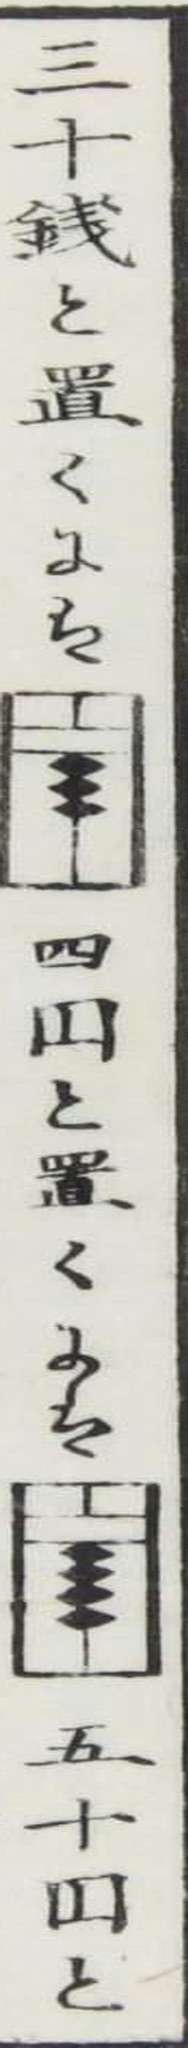三十銭と置くには四円と置くには五十円と
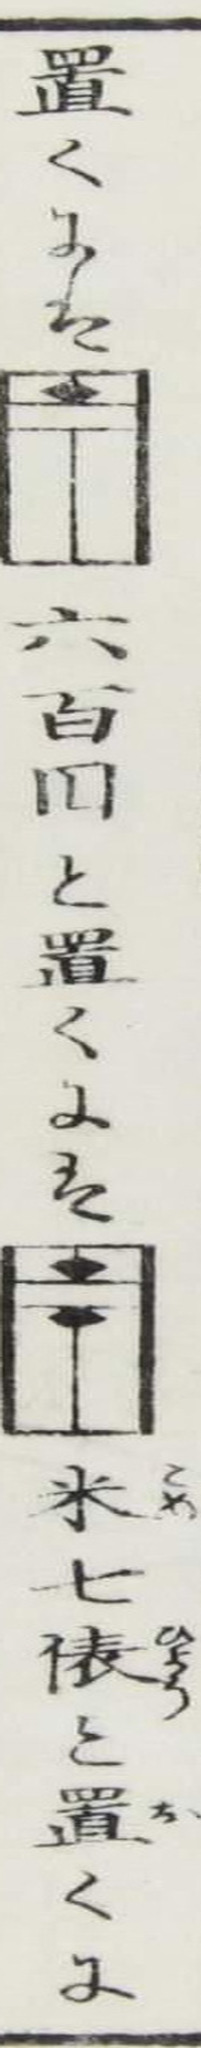置くには六百円と置くには米七俵と置くに
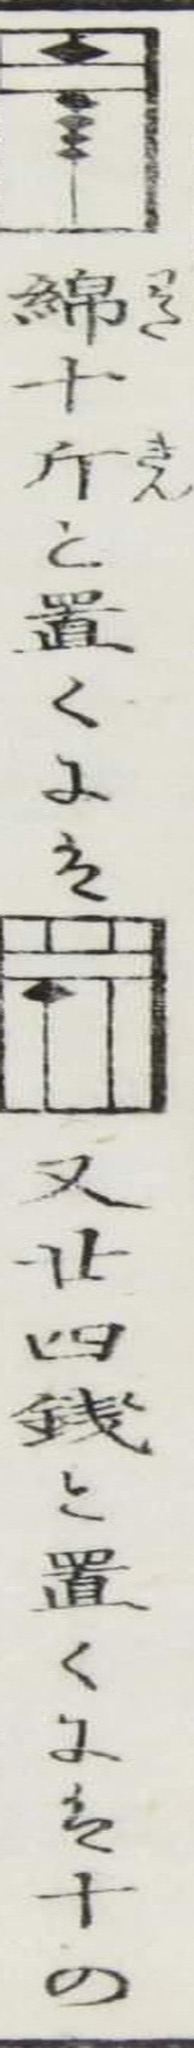綿十斤と置くには又廿四銭と置くには十の
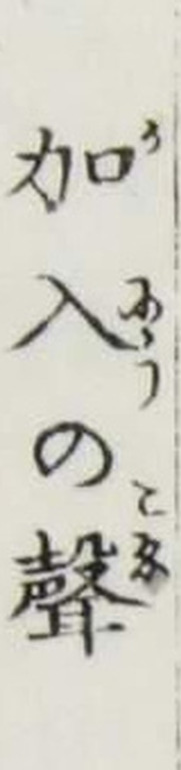加入の声
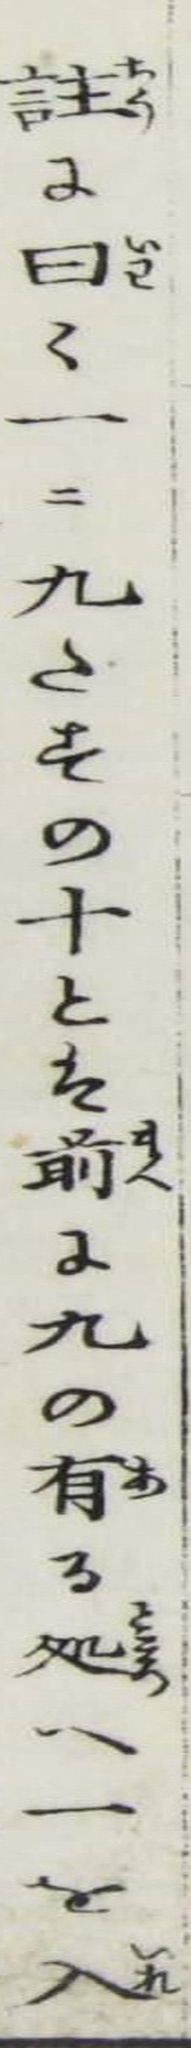註に曰く一ニ九たすの十とは前に九の有る処へ一を入
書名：明治小學塵劫記 卷1
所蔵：東京学芸大学教育コンテンツアーカイブ
